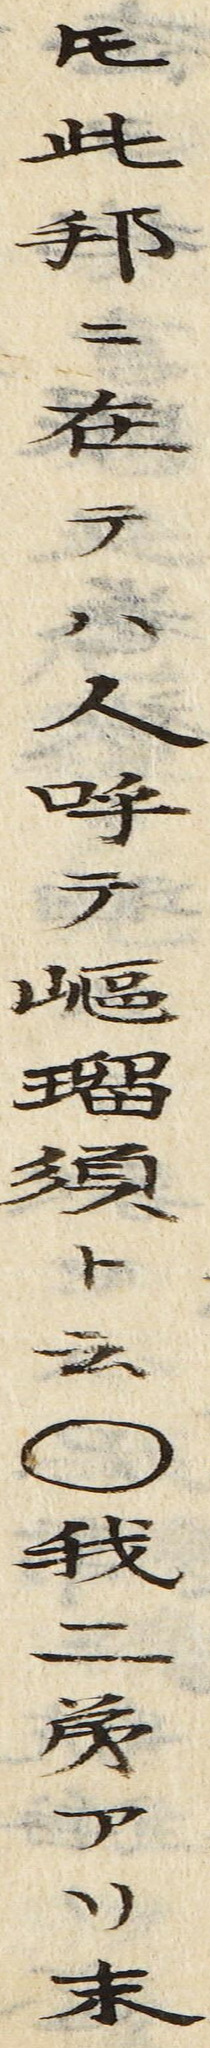トモ此邦ニ在テハ人呼テ嶇瑠須ト云○我二弟アリ末
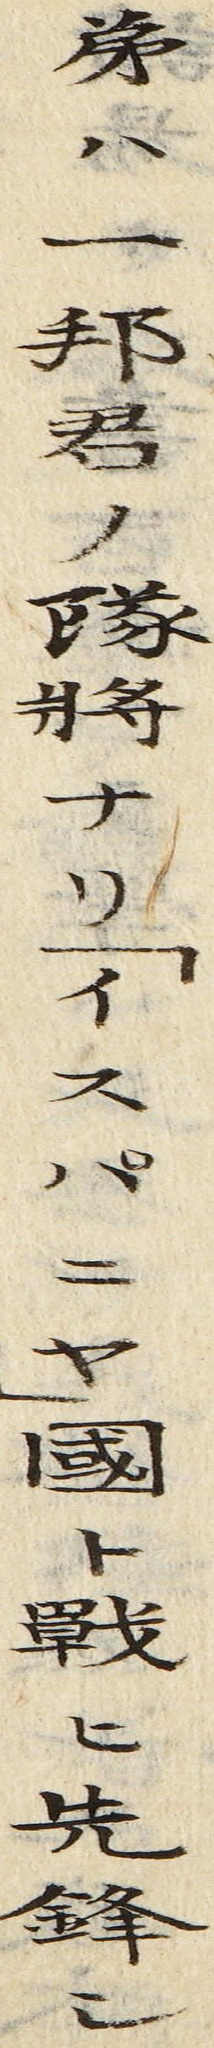弟ハ一邦君ノ隊将ナリ「イスパニヤ」国と戦ヒ先鋒シ
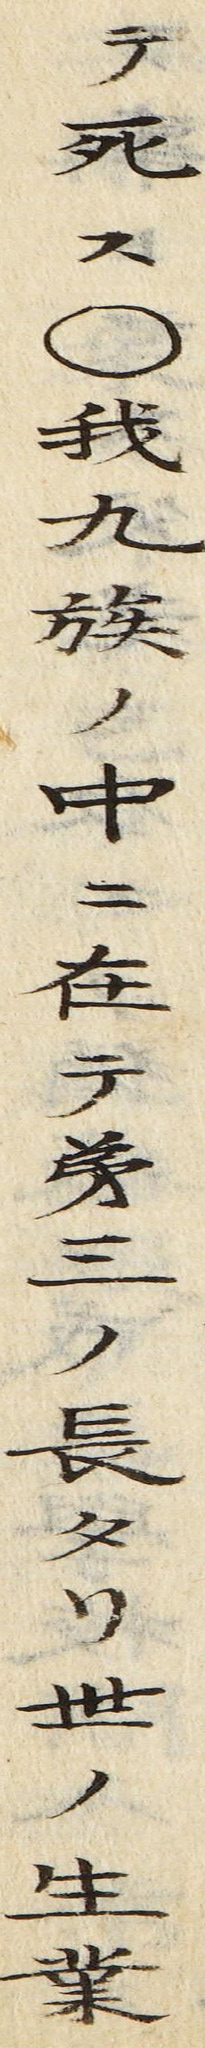テ死ス○我九族ノ中ニ在テ第三ノ長タリ世ノ生業

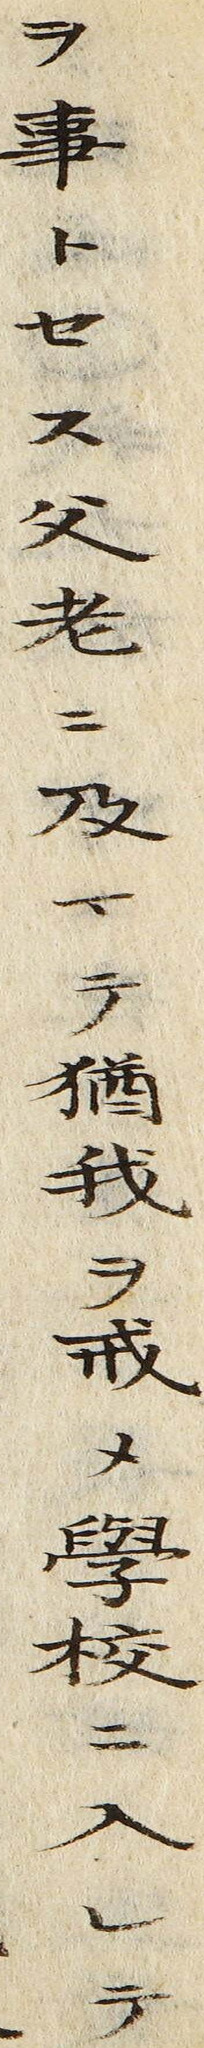ヲ事トセス父老ニ及マテ猶我ヲ戒メ学校ニ入レテ
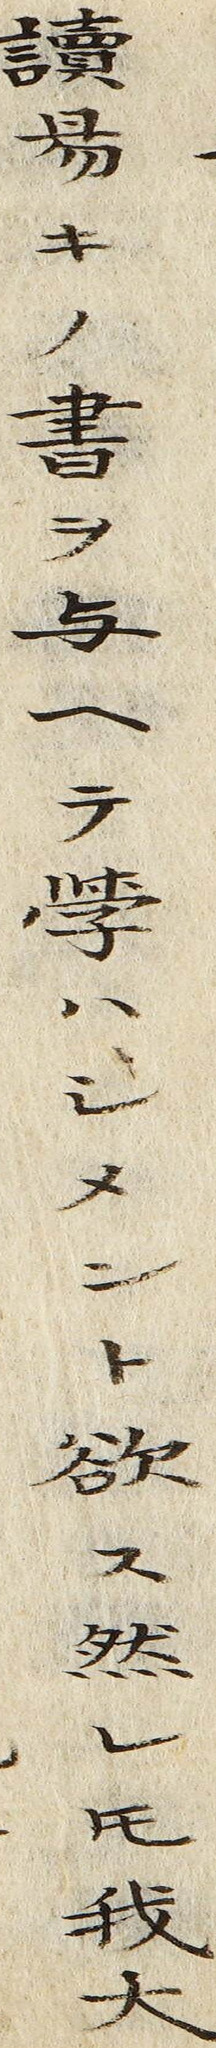読易キノ書ヲ与ヘテ学ハシメント欲ス然レトモ我大
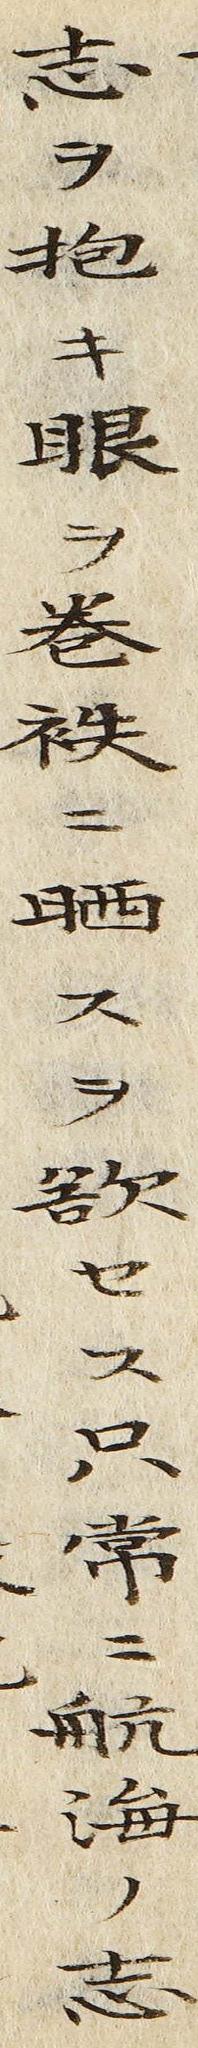志ヲ抱キ眼ヲ巻袟ニ晒スヲ欲セス只常ニ航海ノ志
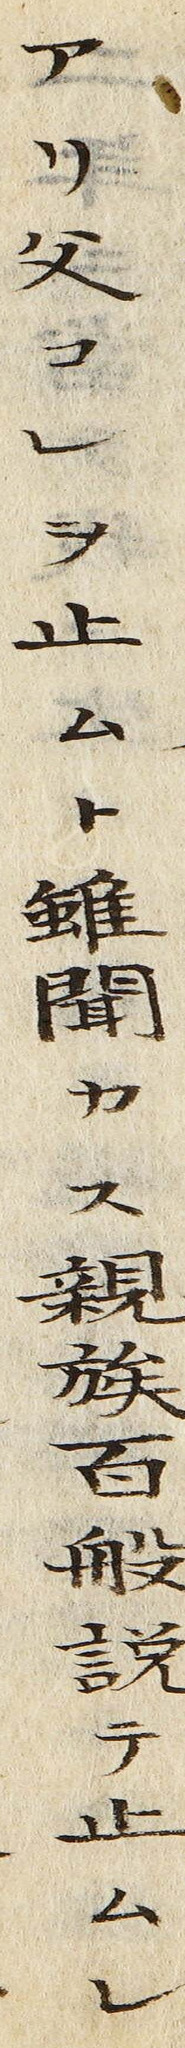アリ父コレヲ止ムト雖聞カス親族百般説テ止ムレ
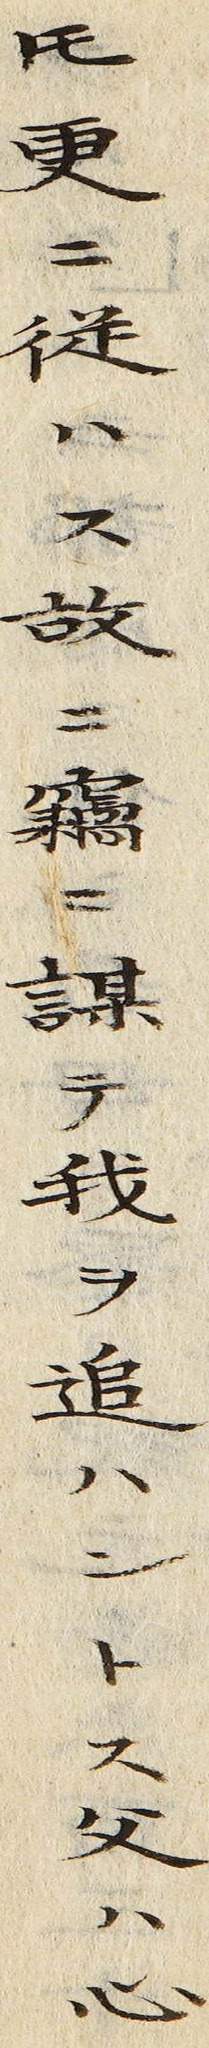トモ更ニ従ハス故ニ窃ニ謀テ我ヲ追ハントス父ハ心
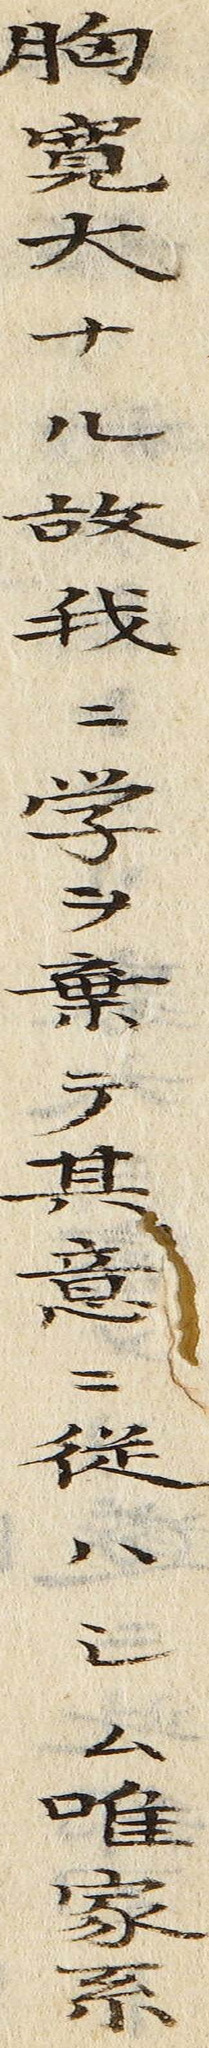胸寛大ナル故我ニ学ヲ棄テ其意ニ従ハシム唯家系
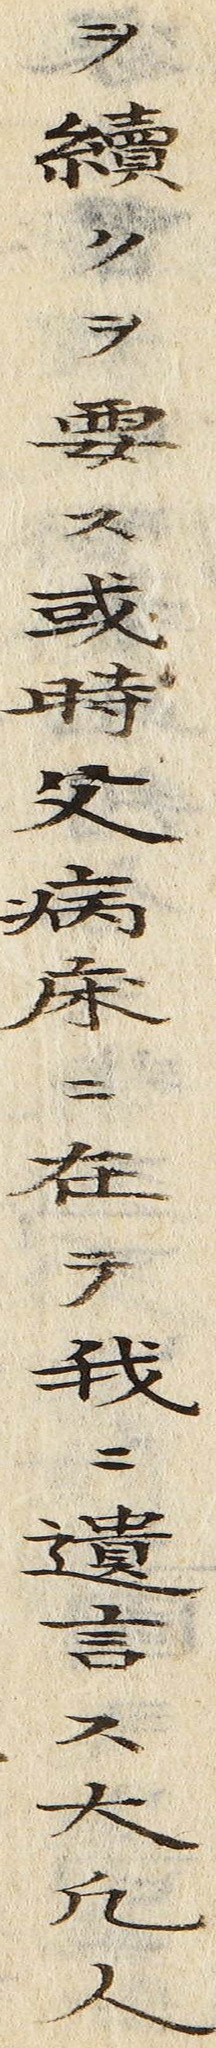ヲ続クヲ要ス或時父病床ニ在テ我ニ遺言ス大凡人
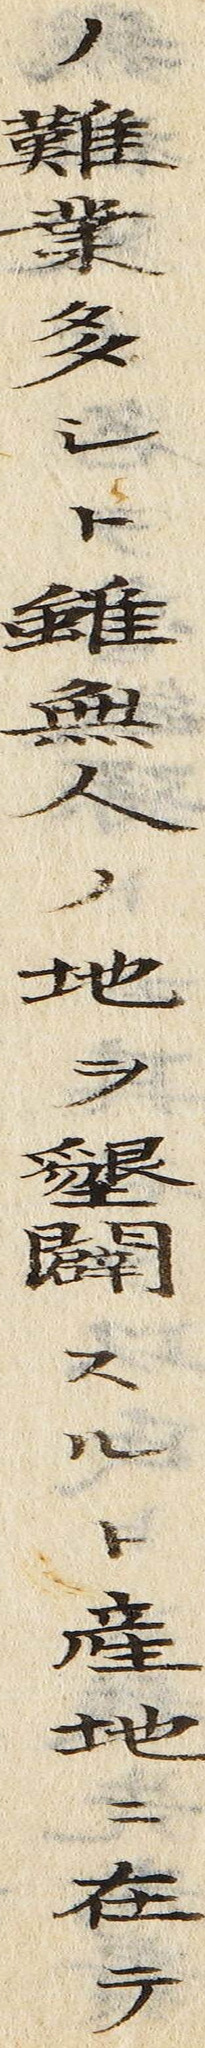ノ難業多シト雖無人ノ地ヲ墾闢スルト産地ニ在テ
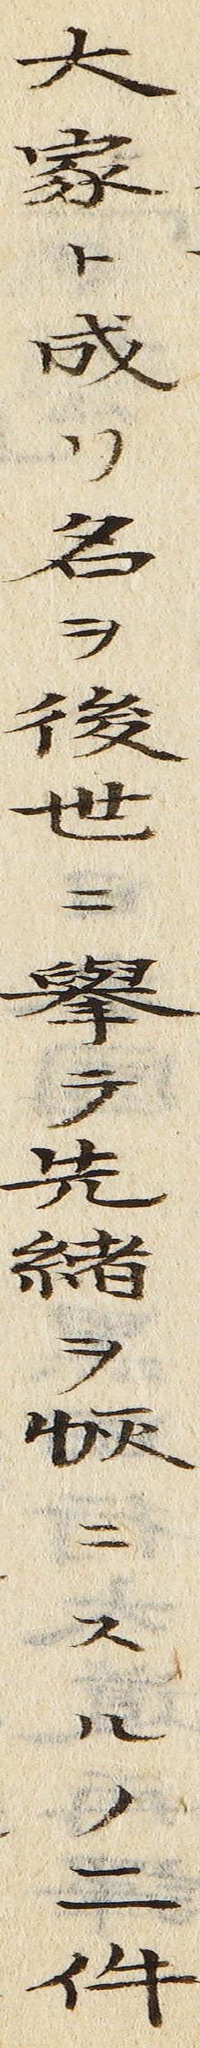大家ト成リ名ヲ後世ニ挙テ先緒ヲ恢ニスルノ二件
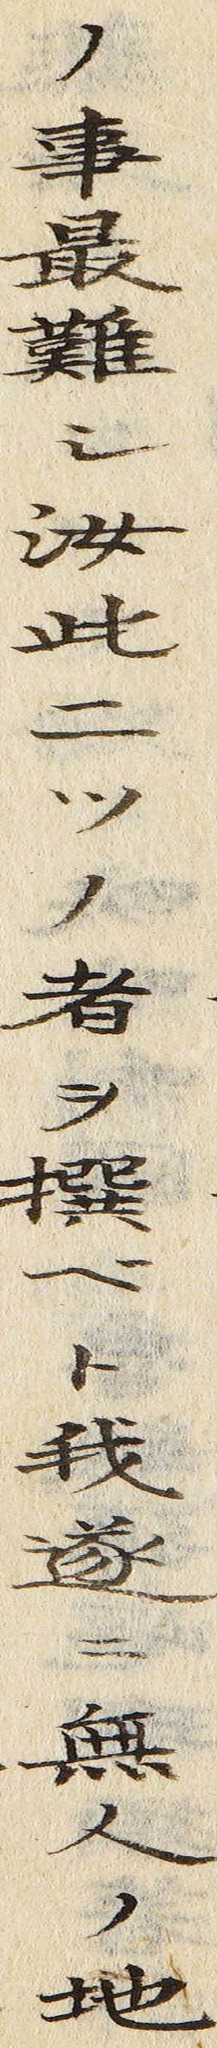ノ事最難シ汝此二ツノ者ヲ撰ベト我遂ニ無人ノ地
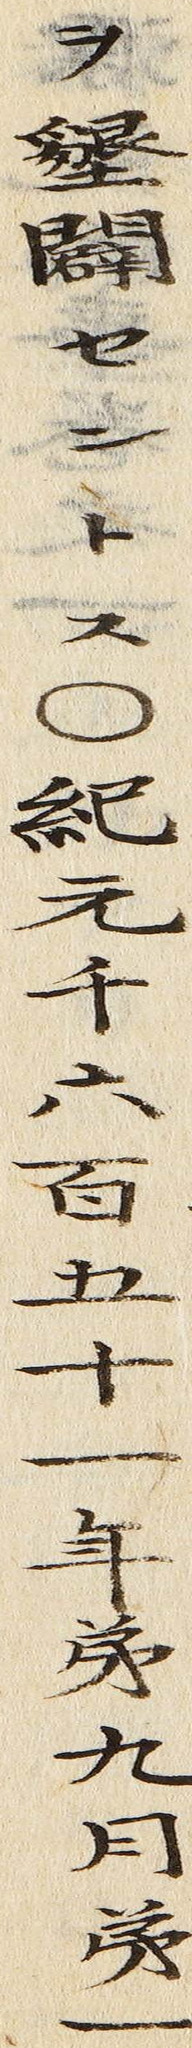ヲ墾闢セントス○紀元千六百五十一年第九月第一
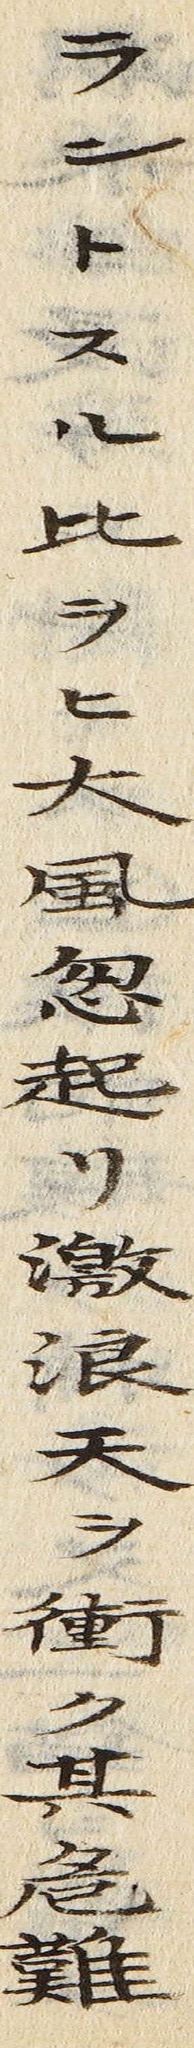ラントスル比ヲヒ大風忽起リ激浪天ヲ衝ク其危難
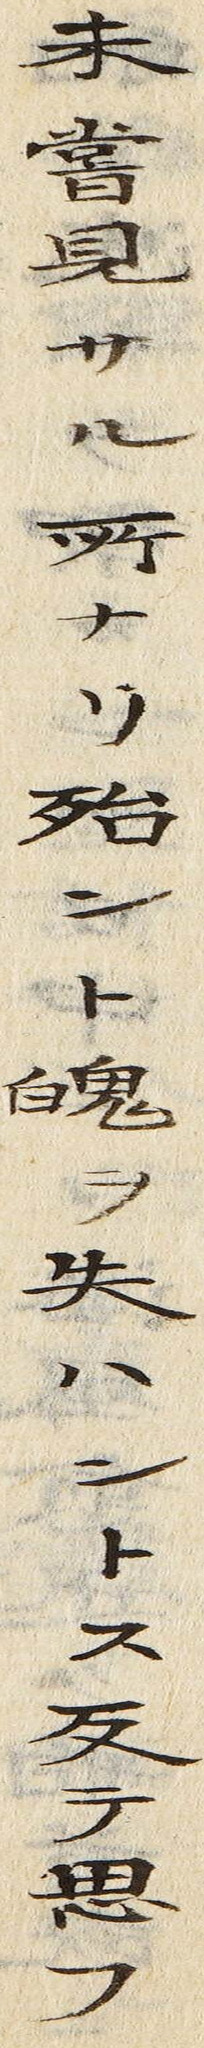未嘗見サル所ナリ殆ント魄ヲ失ハントス反テ思フ
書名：漂流紀事
